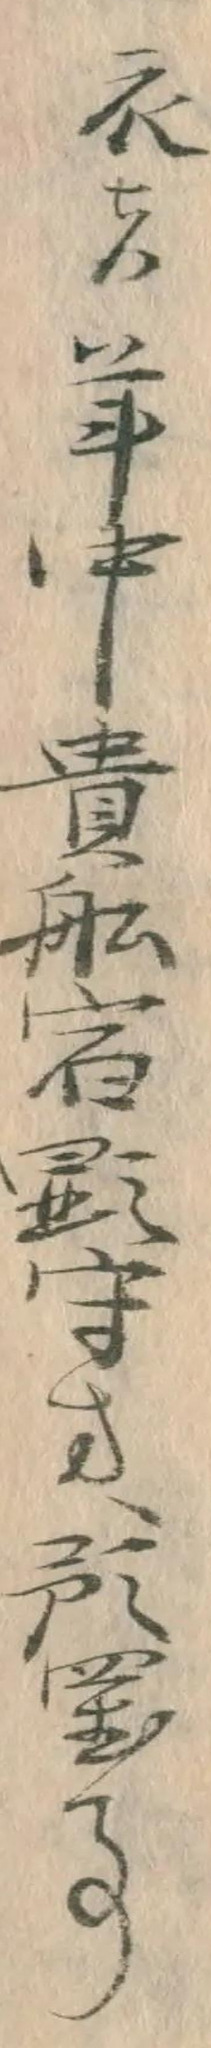衣者年中貴舩宿顕守方へ預置事
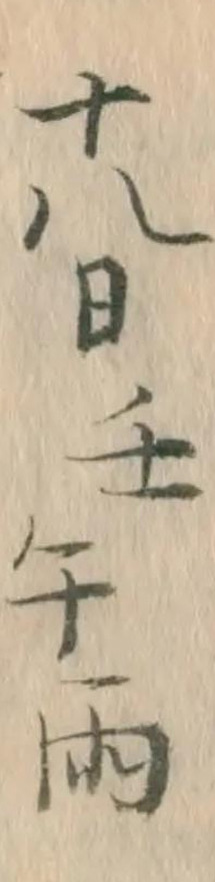十八日壬午雨

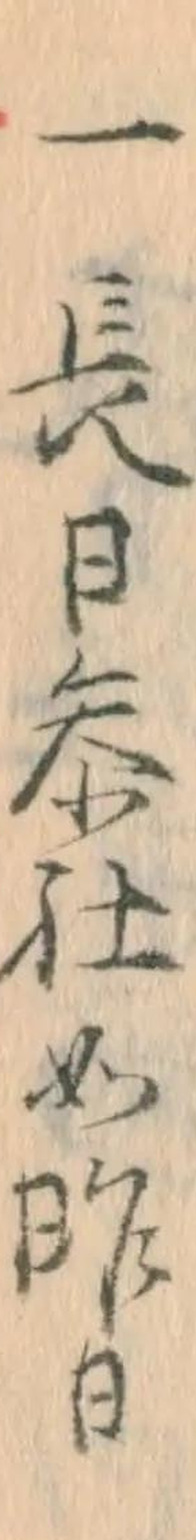一長日参社如昨日
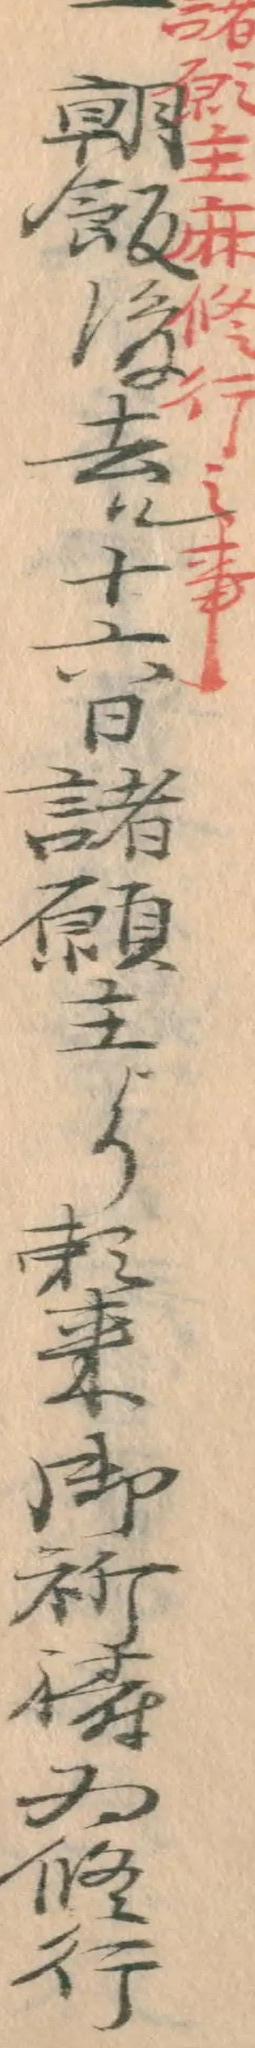一朝飯後去ル十六日諸願主より頼来御祈祷為修行
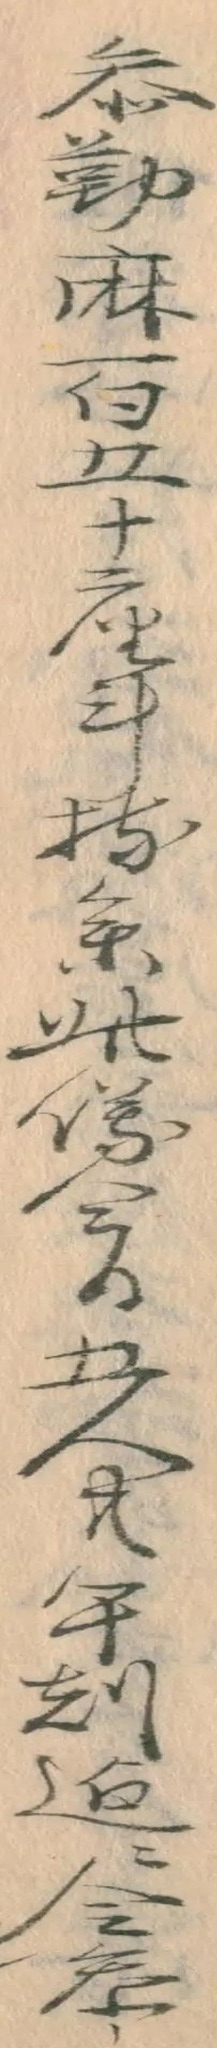参勤麻百五十座斗持参此儀今日五人共午刻迄に令参
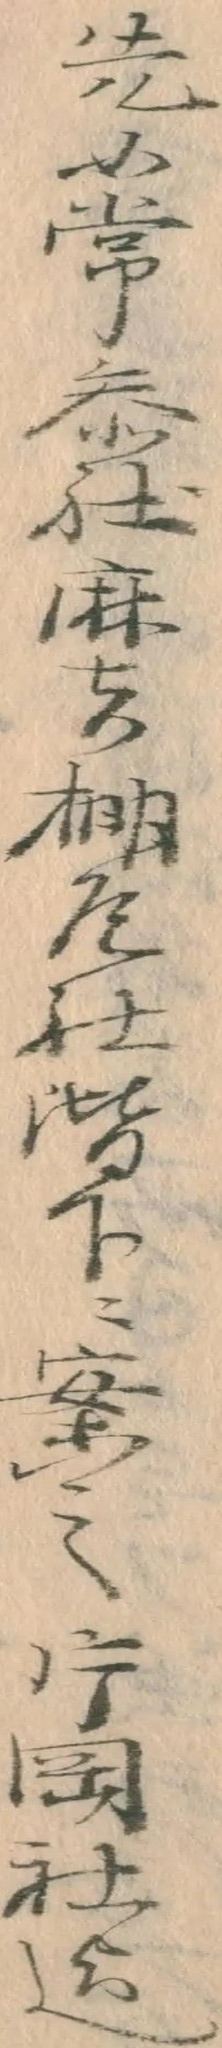先如常参社麻者棚尾社階下ニ案之片岡社迄
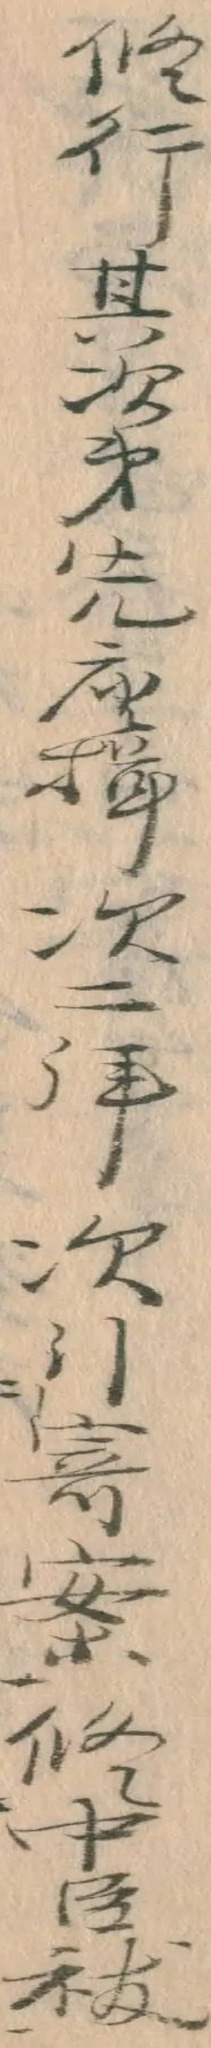修行其次第先座揖次二拝次引寄案修中臣献
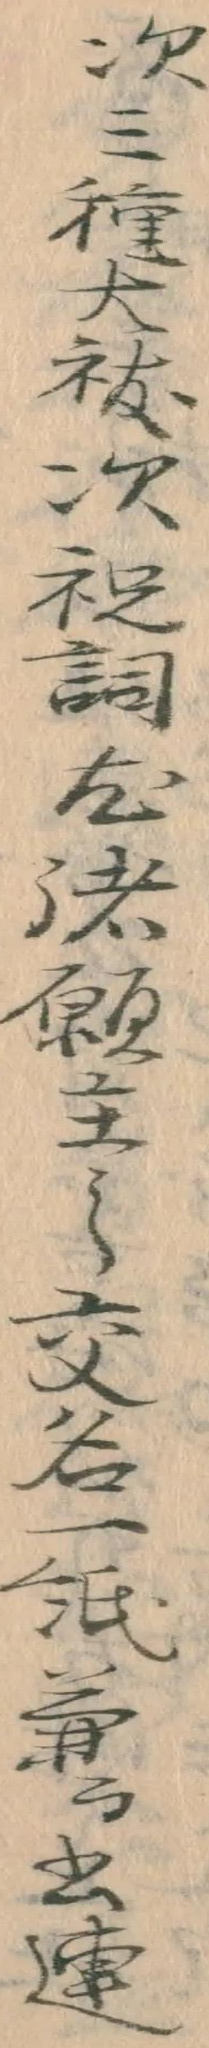次三種大祓次祝詞尤諸願主之交名一紙兼而書連
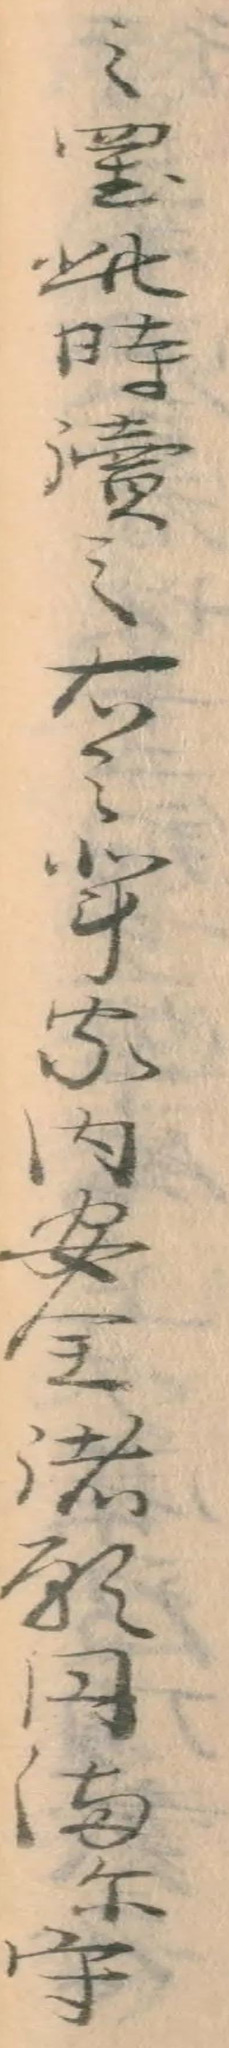之置此時讀之右之輩家内安全諸願円満尓守
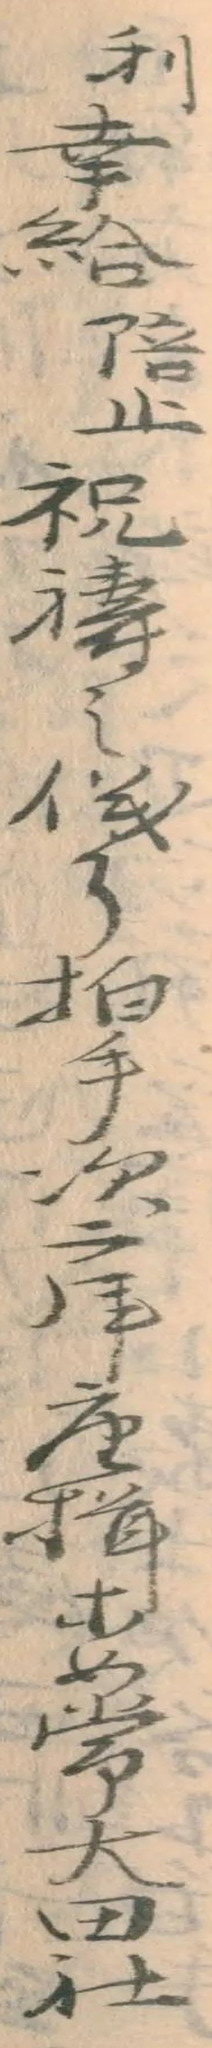利奉給陪止祝祷之儀了拍手次二拝座揖等如常大田社
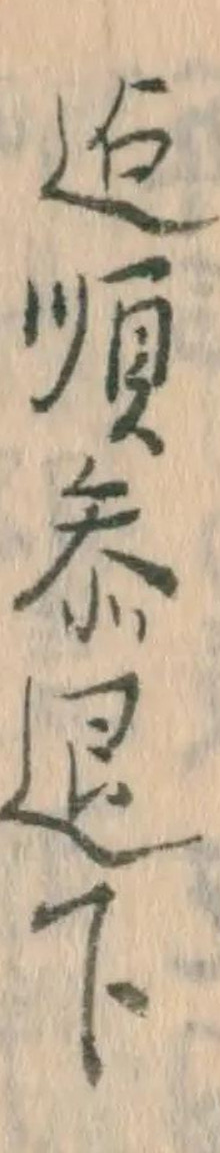迄順参退下
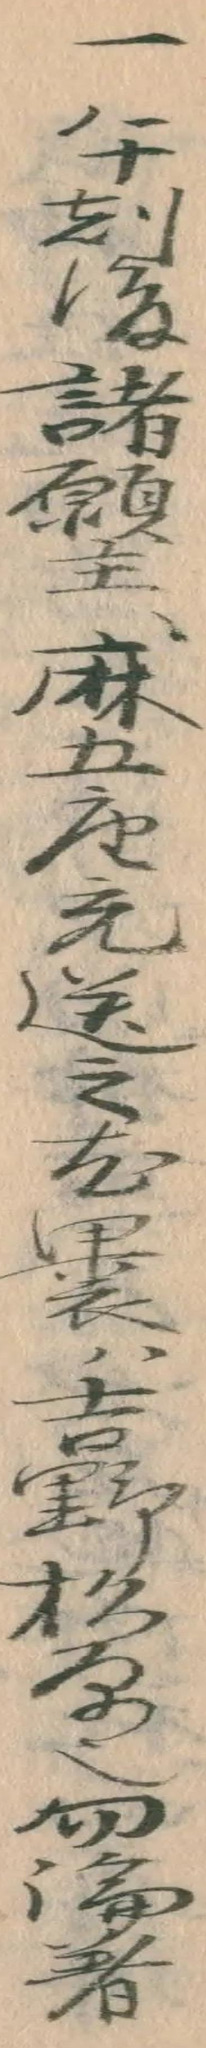一午刻後諸領主へ麻五座充送之尤包ハ吉野杦原也勿論着
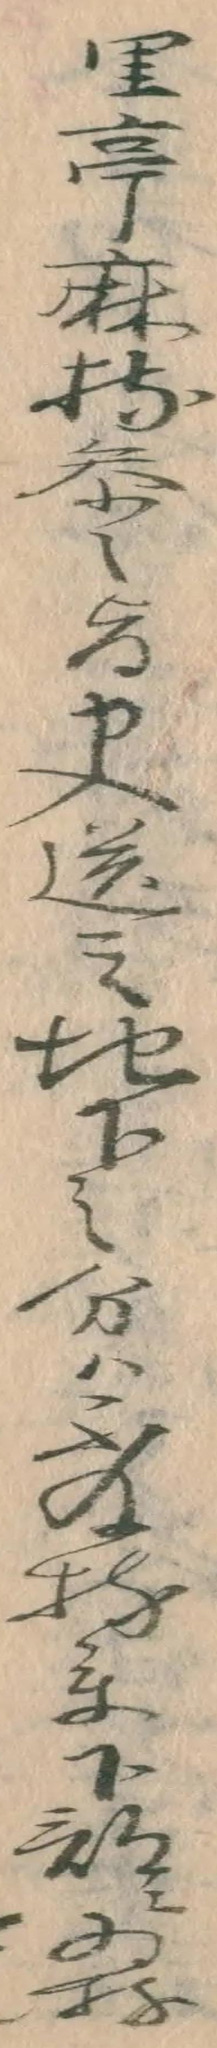里亭麻持参之旨申入送之地下之分ハ不及持参下部ニ為持遣也
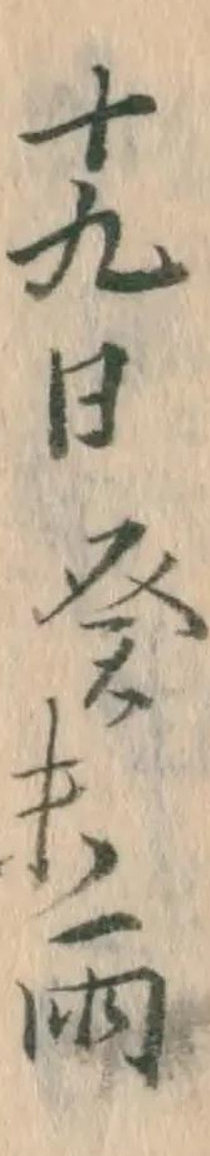十九日癸未雨
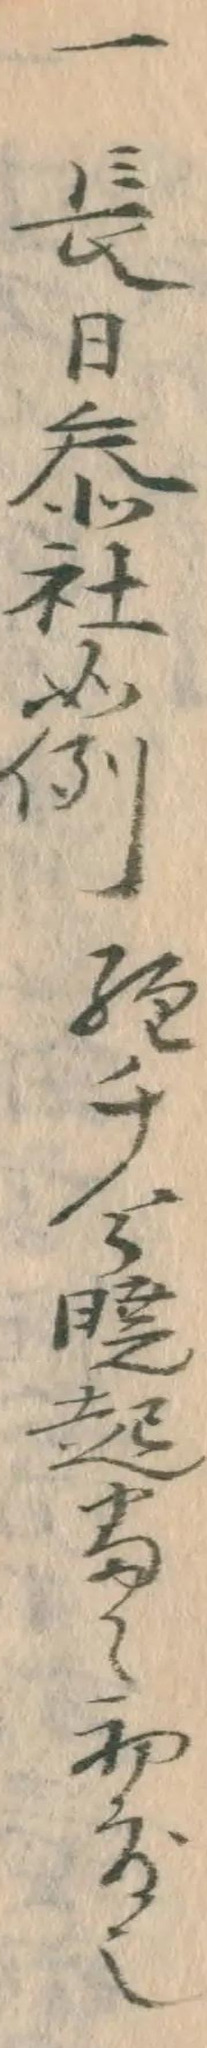一長日参社如例経千今暁起番也初度也
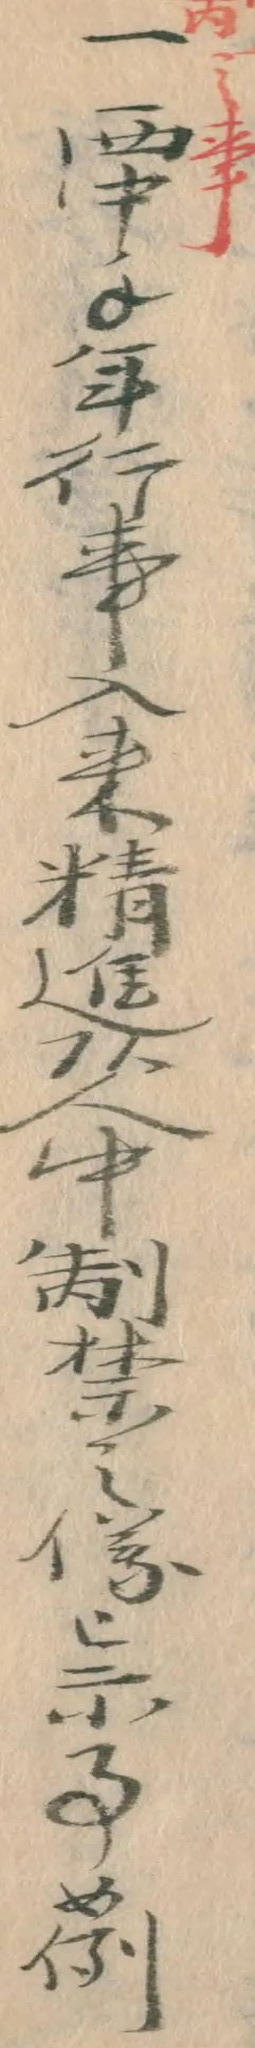一西中手年行事入来精進頭人中制禁之儀被示事如例
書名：賀茂社記録. 第72冊
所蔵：国立国会図書館 National Diet Library, JAPAN
